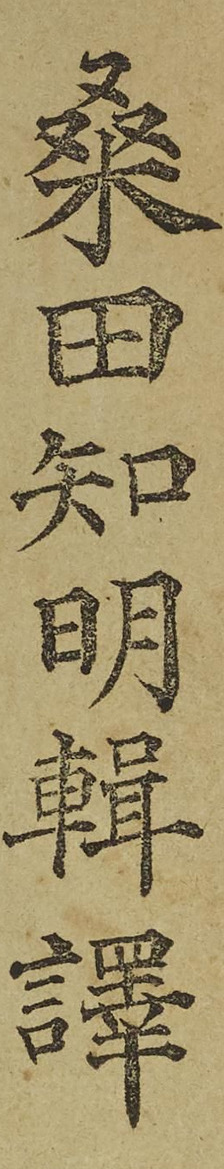桑田知明輯訳
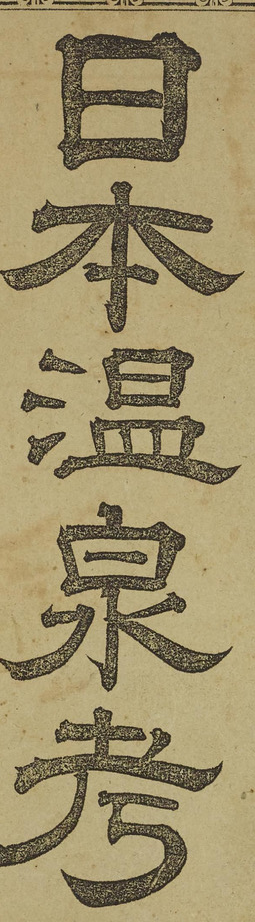日本温泉考
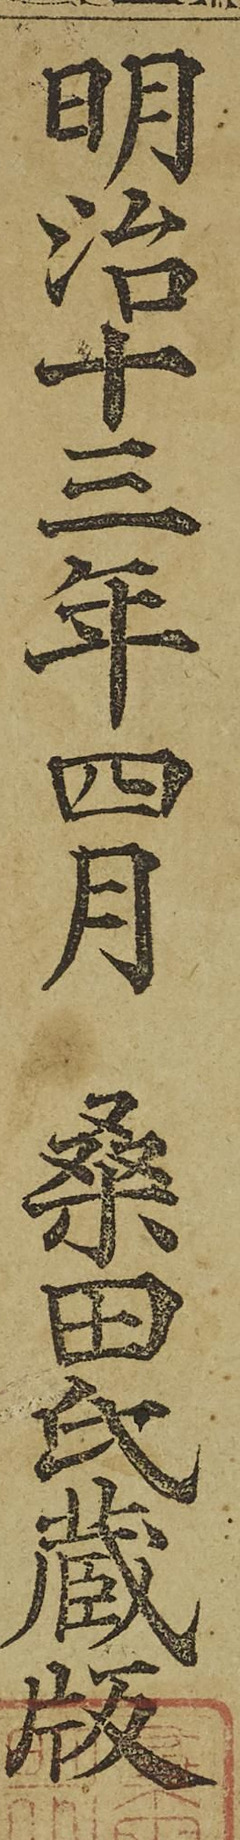明治十三年四月桑田氏蔵版

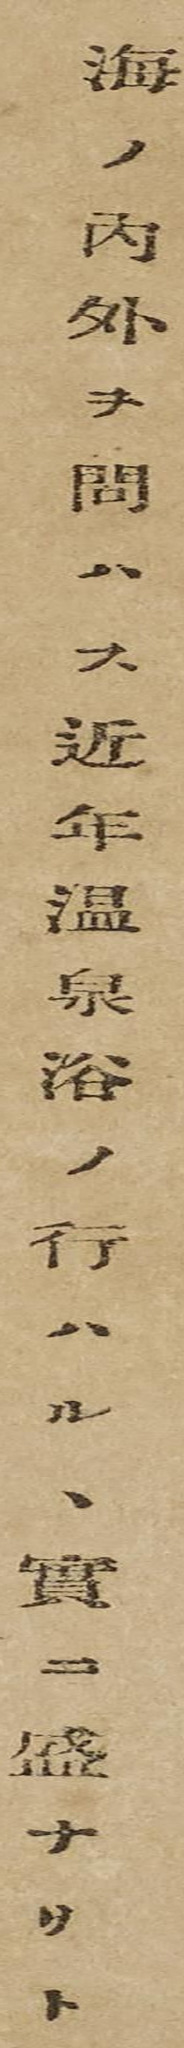海ノ内外ヲ問ハス近年温泉浴ノ行ハルヽ実ニ盛ナリト
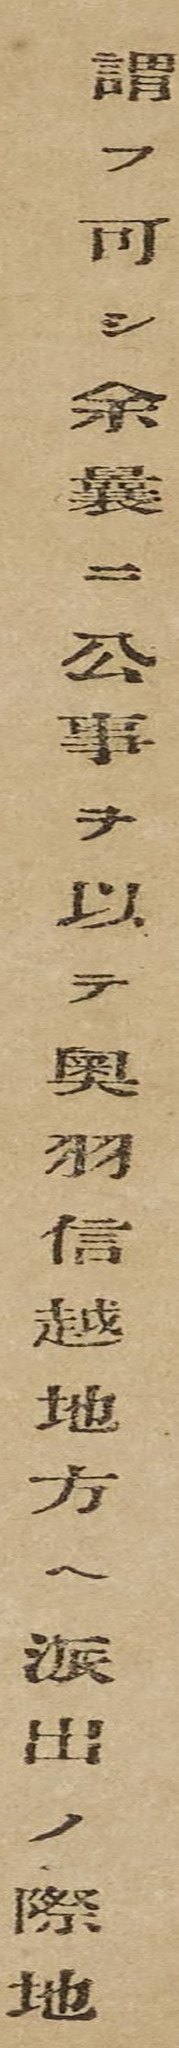謂フ可シ余曩ニ公事ヲ以テ奥羽信越地方ヘ派出ノ際地
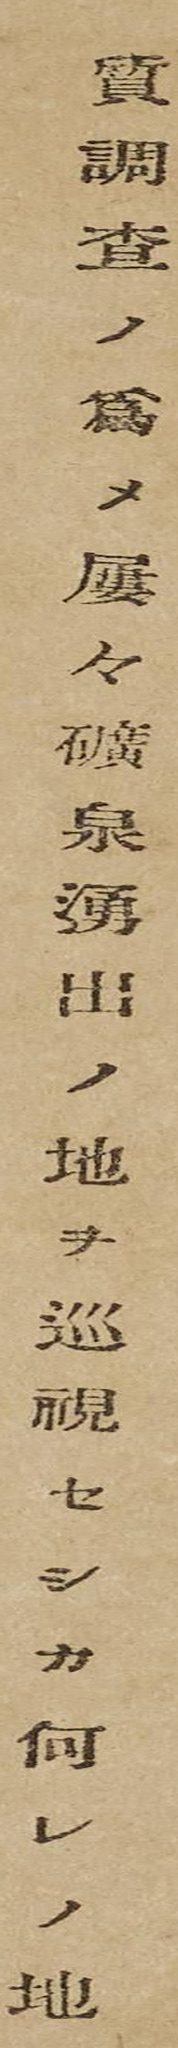質調査ノ為メ屢々礦泉湧出ノ地ヲ巡視セシカ何レノ地
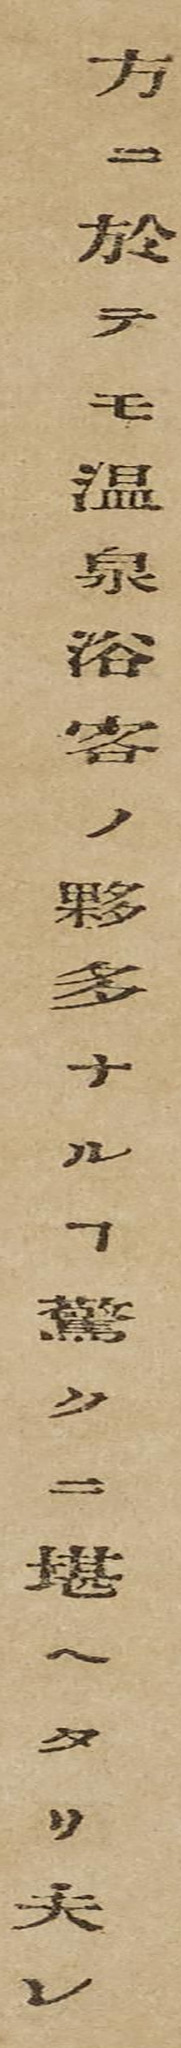方ニ於テモ温泉浴客ノ夥多ナルコト驚クニ堪ヘタリ夫レ
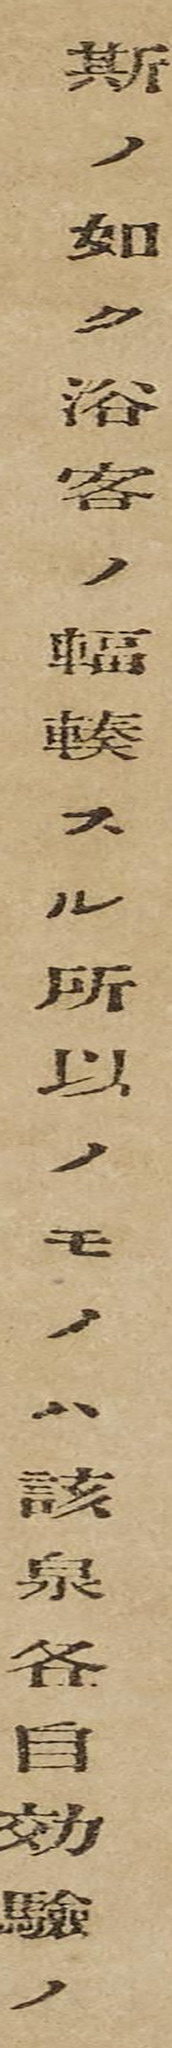斯ノ如ク浴客ノ輻輳スル所以ノモノハ該泉各自効験ノ
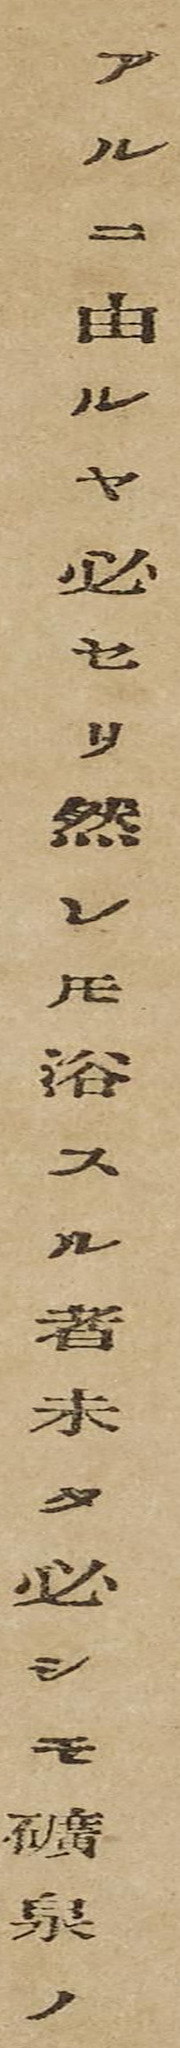アルニ由ルヤ必セリ然レトモ浴スル者未タ必シモ礦泉ノ
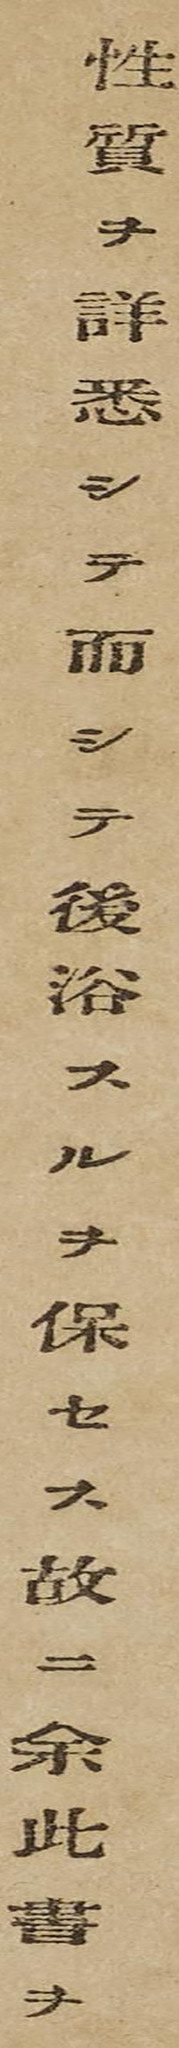性質ヲ詳悉シテ而シテ後浴スルヲ保セス故ニ余此書ヲ
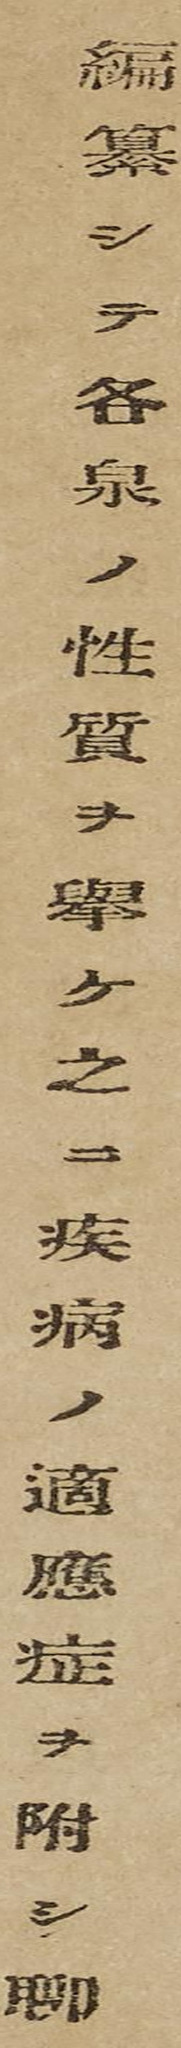編纂シテ各泉ノ性質ヲ挙ケ之ニ疾病ノ適応症ヲ附シ聊
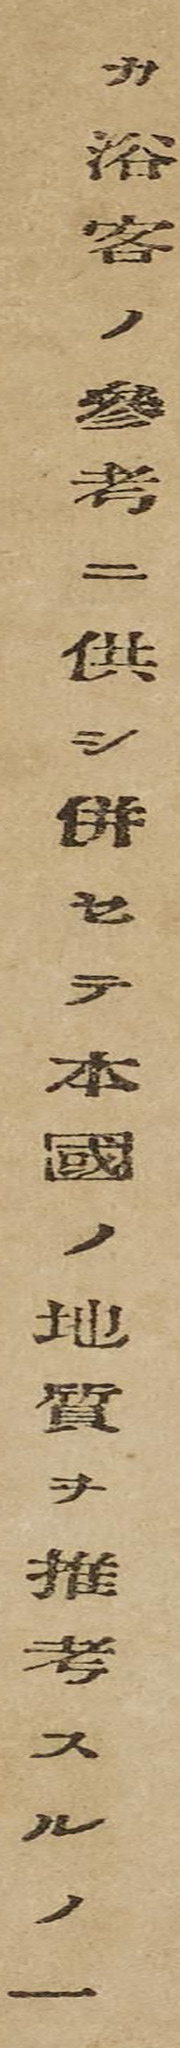カ浴客ノ参考ニ供シ併セテ本国ノ地質ヲ推考スルノ一
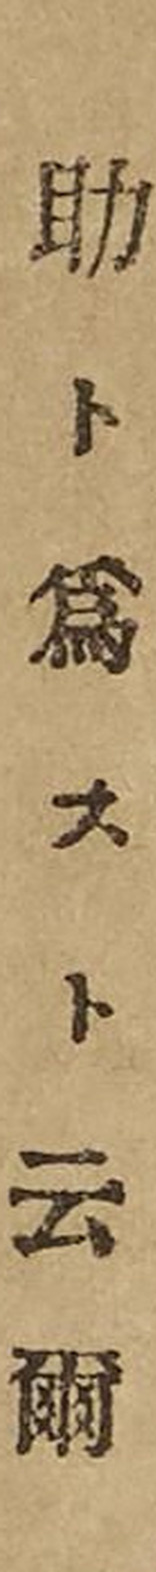助ト為スト云爾

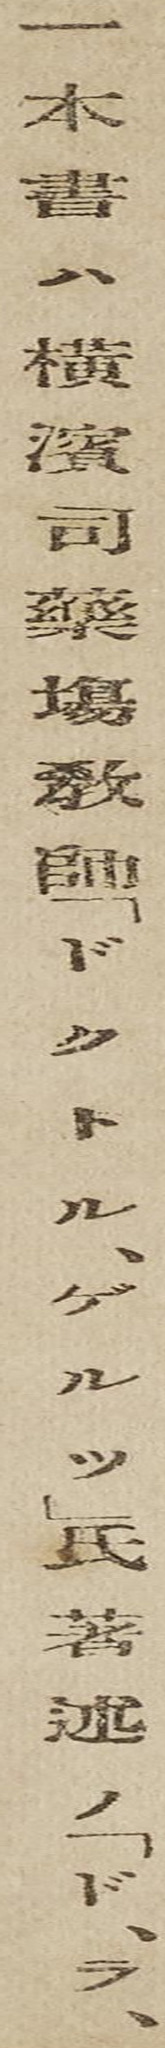一本書ハ横浜司薬場教師「ドクトル、ゲルツ」氏著述ノ「ド、ラ、
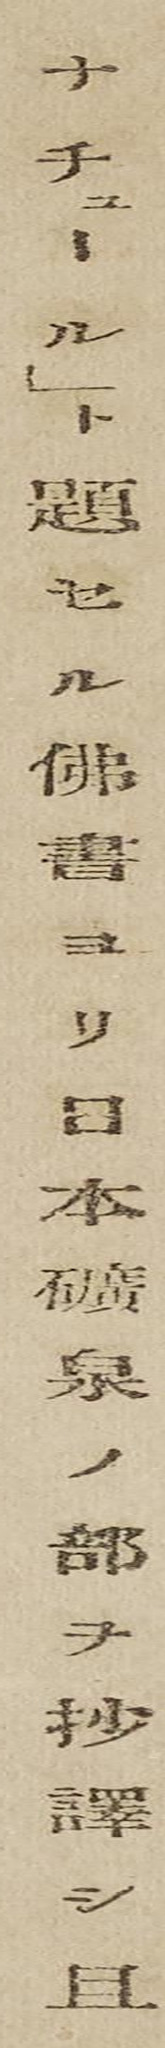ナチュール」ト題セル仏書ヨリ日本礦泉ノ部ヲ抄訳シ且
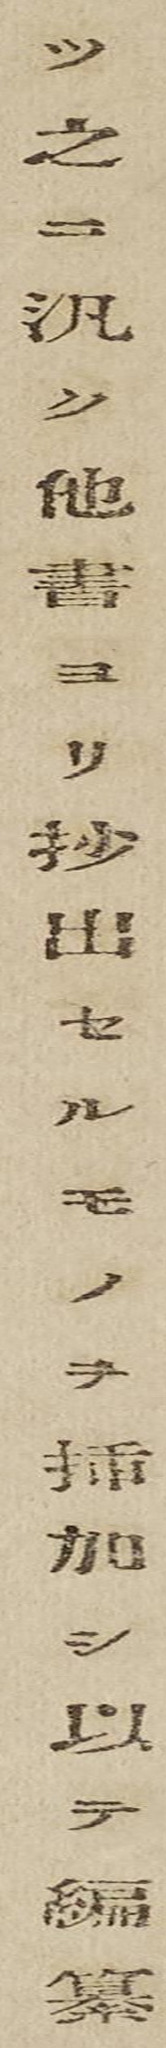ツ之ニ汎ク他書ヨリ抄出セルモノヲ挿加シ以テ編纂
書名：日本温泉考
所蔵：東京大学地震研究所図書室 Earthquake Research Institute Library, The University of Tokyo, JAPAN
